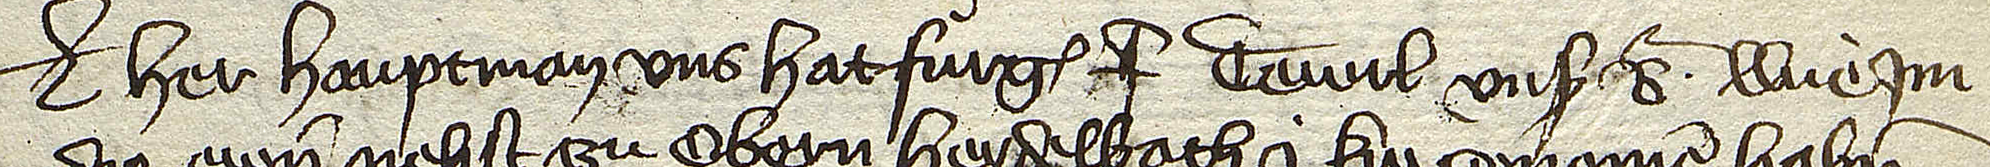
L* her hauptman vns hat fürg* F Tewrl vnſ* B* wie Im
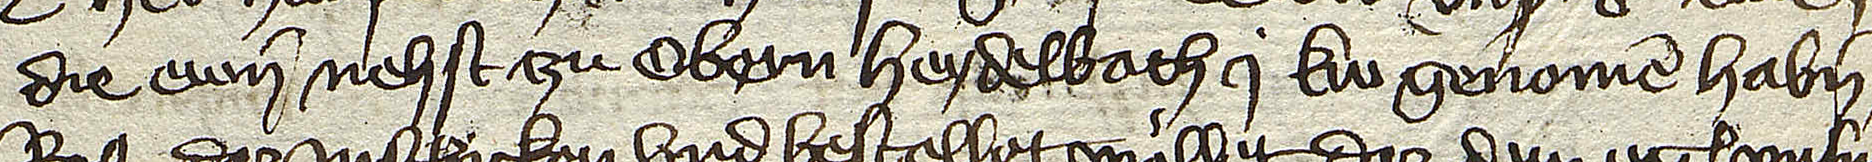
die ewn* nehſt cʒu Obern heydelbach i kw genome* habn*
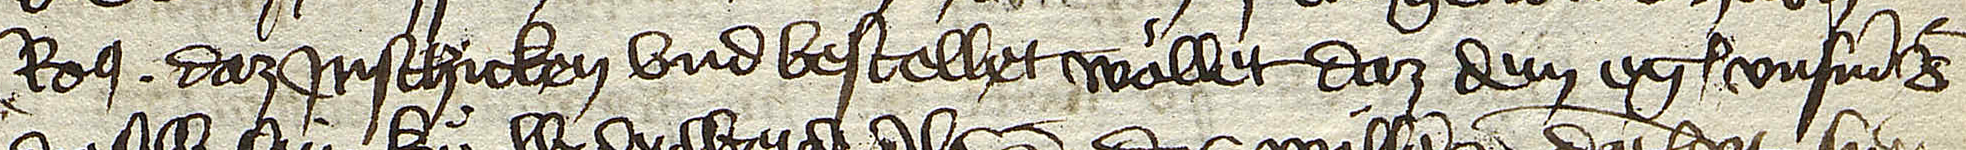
Ro* . daʒ Ir ſchicken vnd beſtellet wöllet daʒ dem eg* vnſ*m B*
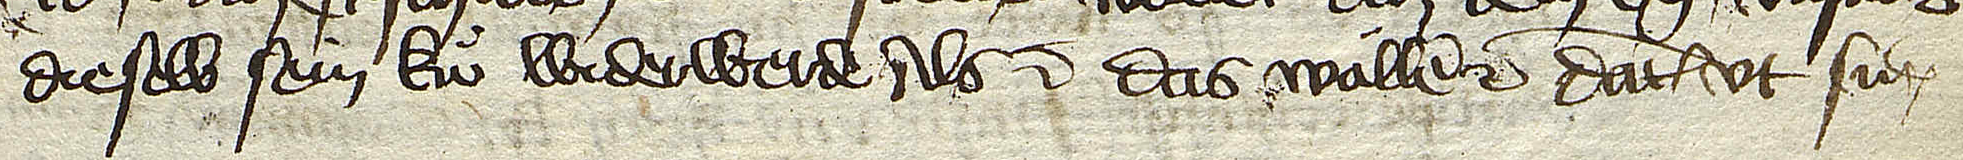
dieſelb ſein kw widerwerde Als ec* das wölle* ec* dat* vt ſup*
